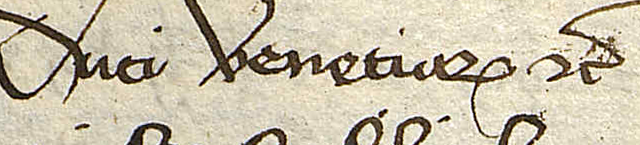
Duci Venetiar* ec*
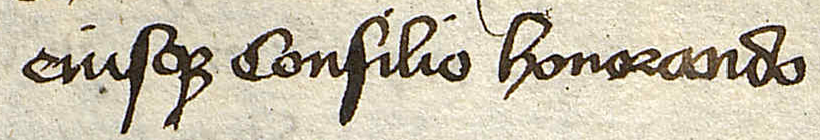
eiuſq* Conſilio honorando
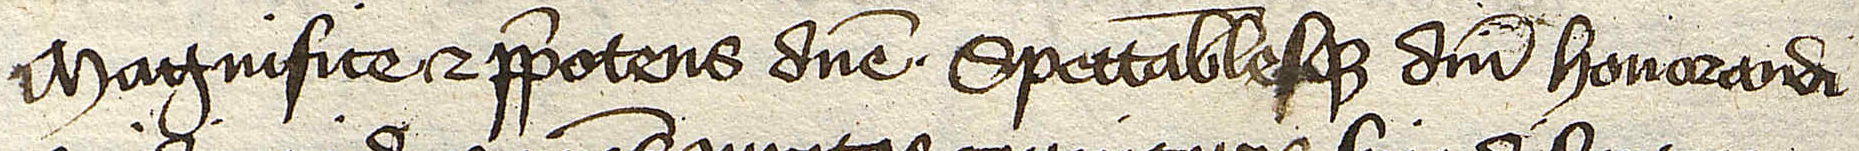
Magnifice @ p*potens d*ne . Spectab*lesq* d*ni honorandi
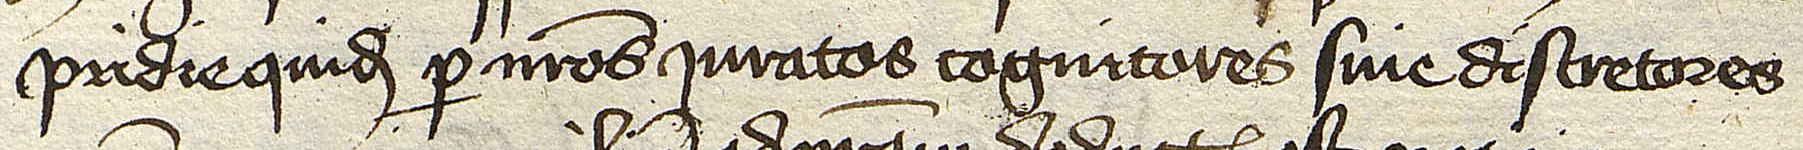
Pridie quid* p* n*ros Iuratos cognitores ſiue diſcretores
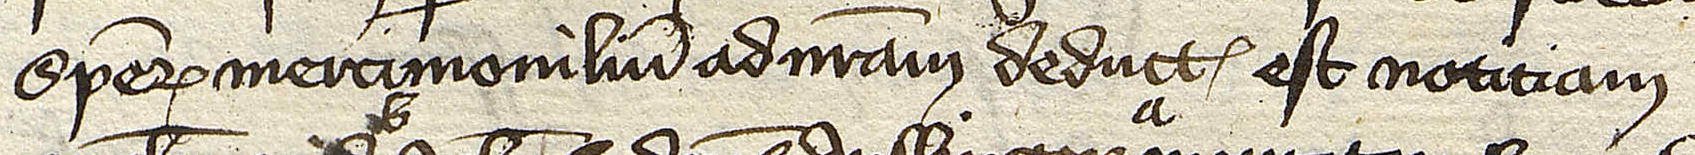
Spe*r* mercimoniliu* ad n*ram deduct* eſt notitiam
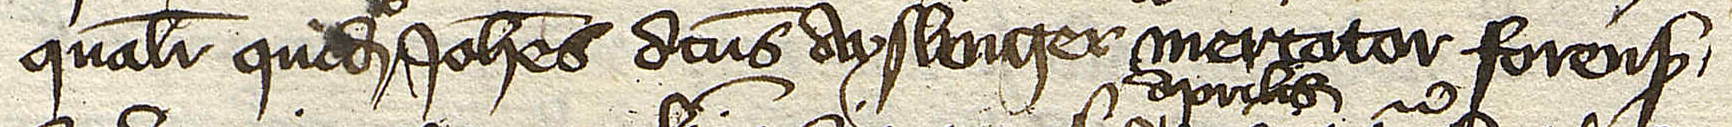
quali* quid* Ioh*es d*tus Ayſlinger mercator forenſ* /
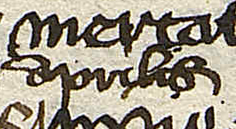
Aprilis
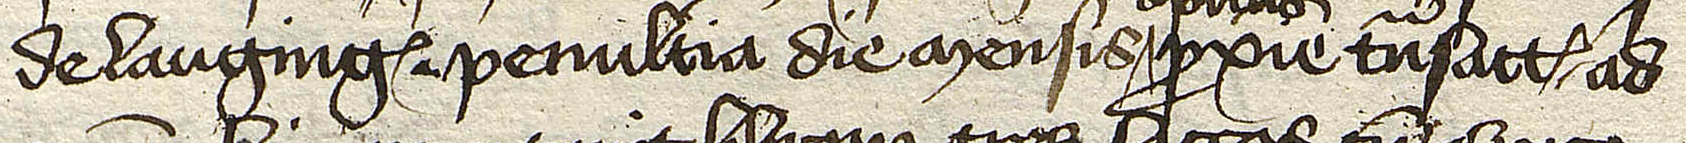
de Lauging* penulti*a die Menſis p*xi*e t*nſact* / ad
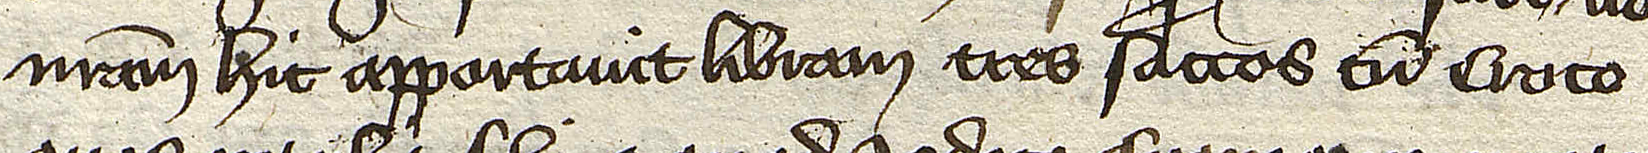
n*ram hic apportauit libram tres ſaccos c*m Croco
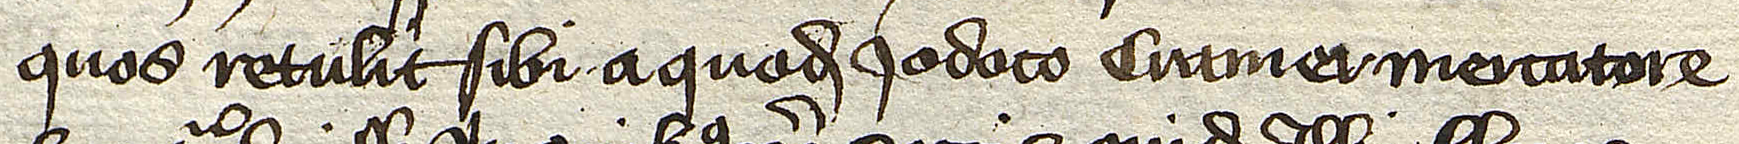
quos retulit ſibi a quod* Iodoco Cramer mercatore
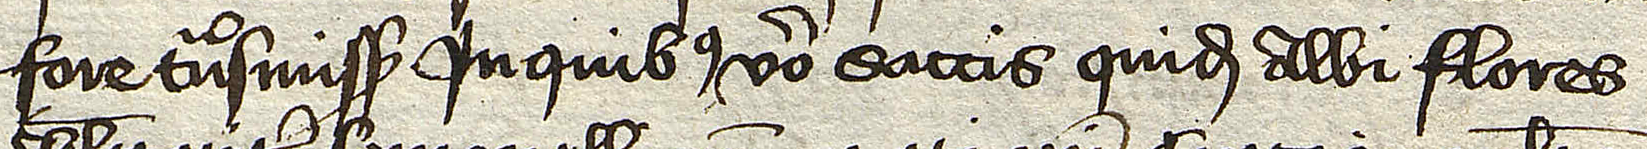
fore t*nſmiſſ* In quib* v*o Saccis quid* Albi flores
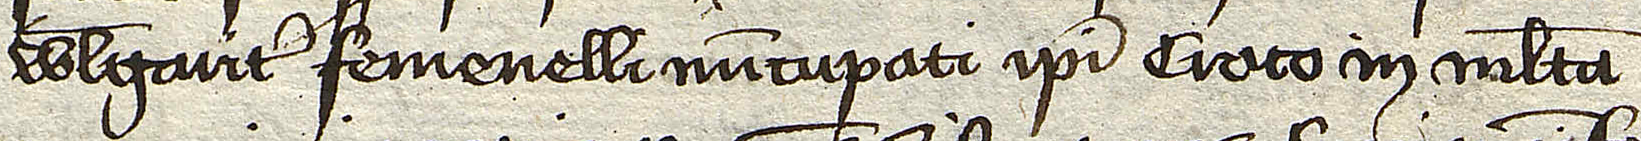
W*lgarit* femenelli nu*cupati ip*i Croco in m*lta
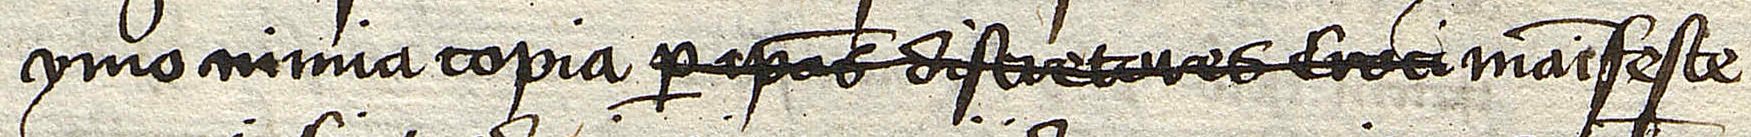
ymo nimia copia p ipos* diſcretores Croci ma*ifeſte
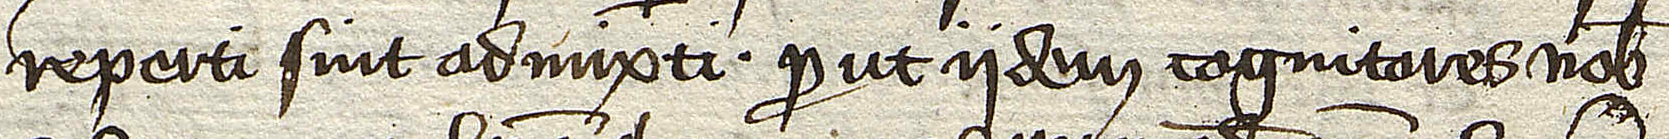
reperti ſint admixiti . p*ut iidem cognitores nob*
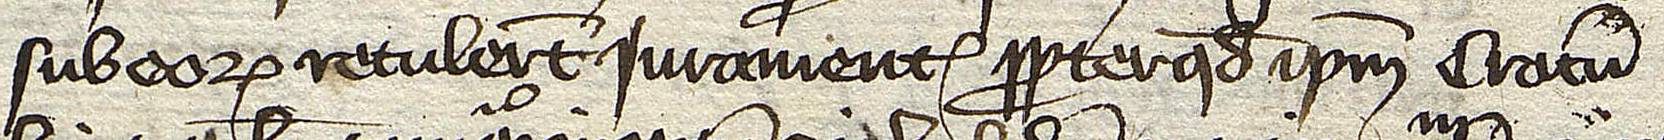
ſub eor* retuler*t Iurament* P*pter q*d ip*m Crocu*
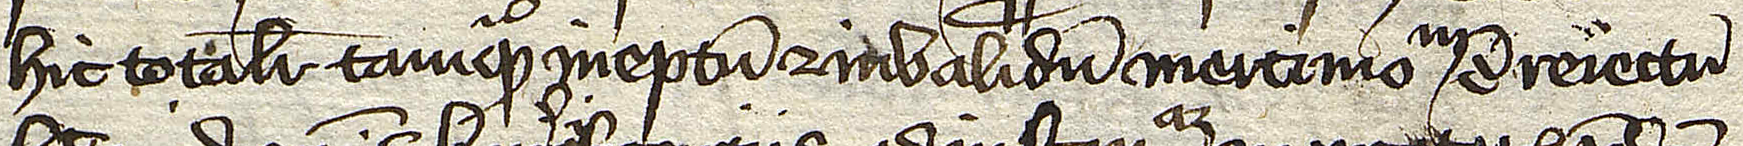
hic totali* tamq* ineptu* @ invalidu* mercimo* e* reiectu*
